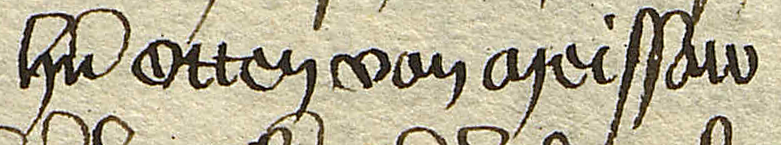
hn* Otten von Meiſſaw
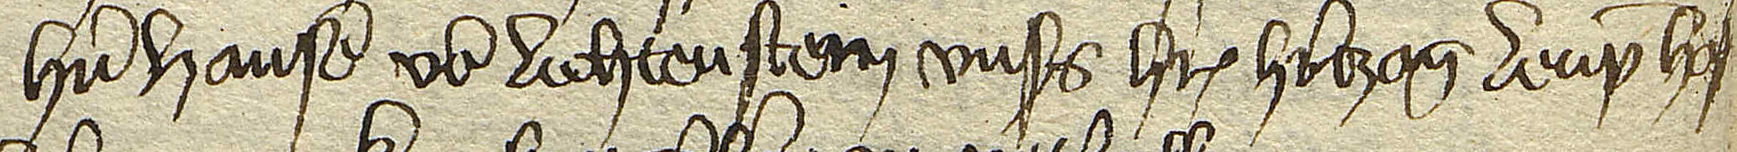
hn* hanſe* vo* L%htenſtein vnſ*s h*r* h*rcʒog leup hof*
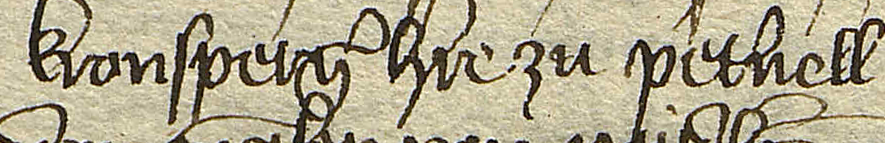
kronſperg* h*re ʒu pet*nell
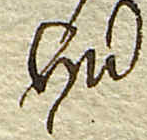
hn*
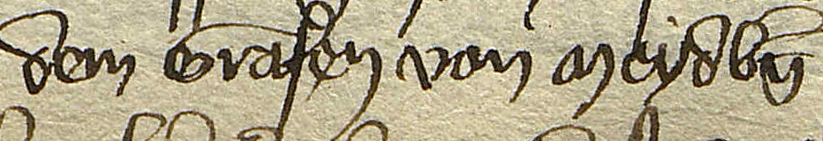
dem Grafen von Meydb*g
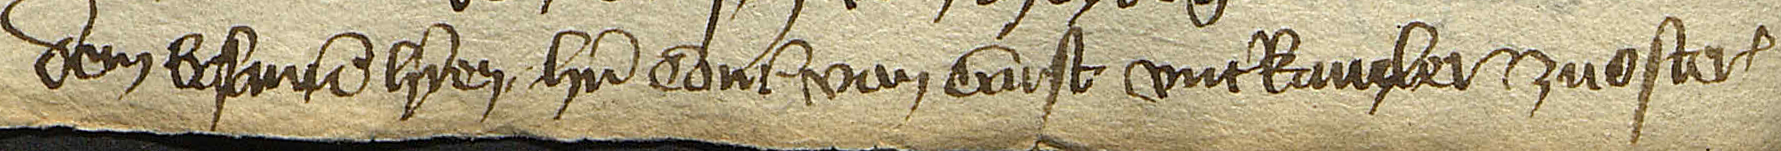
dem Erſame* h*ren hn* Con* von Carſt vnt*kancʒler cʒu Oſter*
